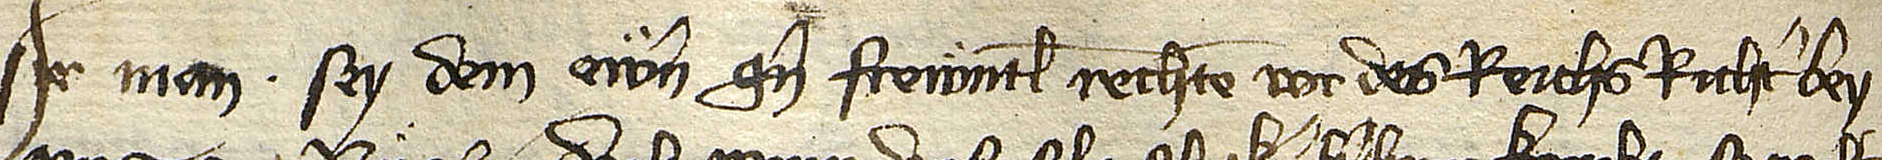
Ir man . ſey dem eẅ*n g*n freẅntl* rechte* vor des Reichs Richt* bey
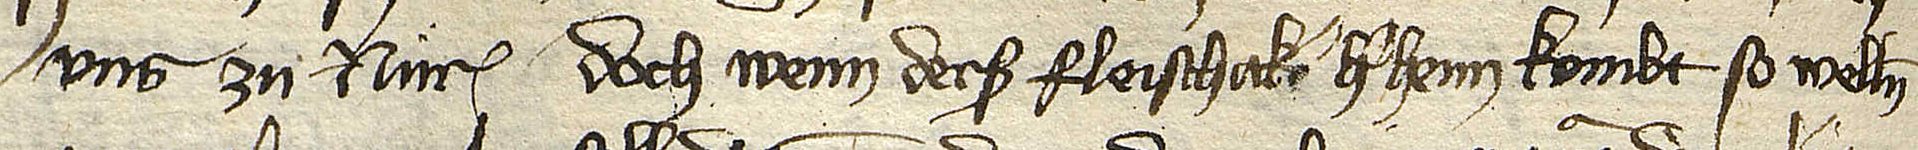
vns ʒu Nür* / Doch wenn derſ* fleiſchak* h*heim kombt ſo welln*
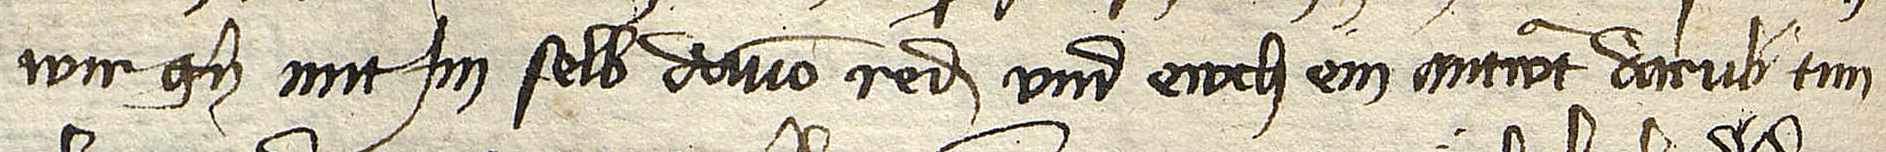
wir g*n mit Im ſelb dauo* red* vnd ewch ein antw*t darub* tun
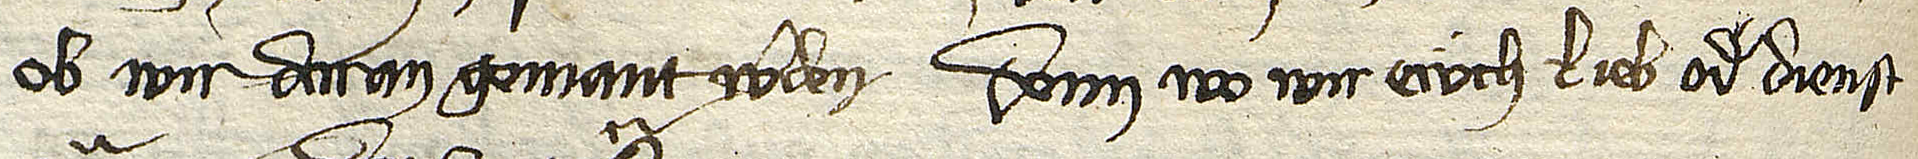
ob wir daran gemant w*den / Denn wo wir eẅch lieb od* dienſt
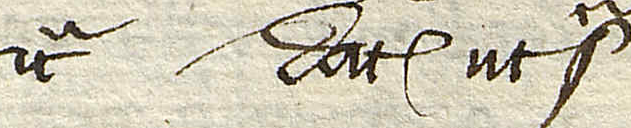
ec* / Dat* ut ſ*
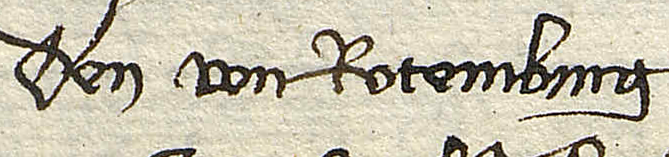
Den von Rotemburg
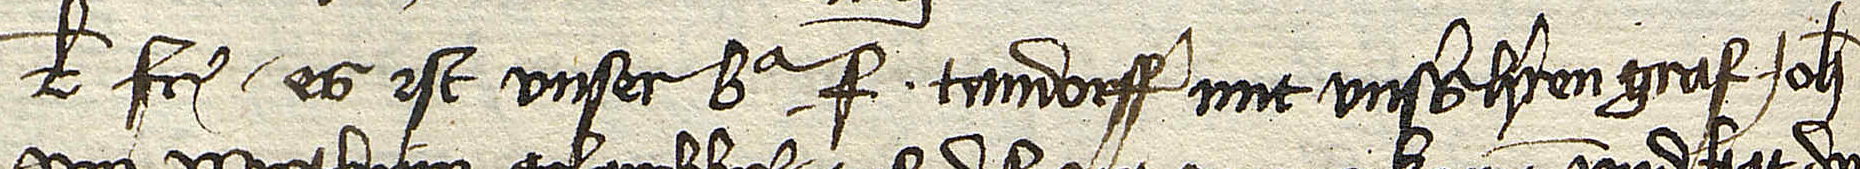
L* fr* / es iſt vnſer b* . F . tandorff* mit vnſ*s h*ren graf Ioh*
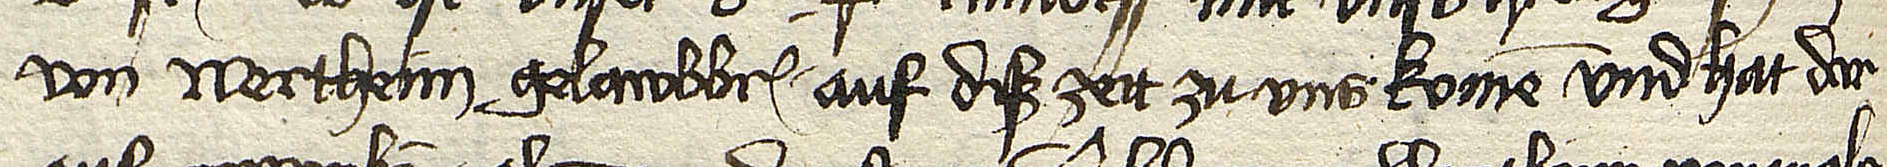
von Wertheim gelawbbr* / auf diſʒ ʒeit ʒu vns kome* vnd hat dar
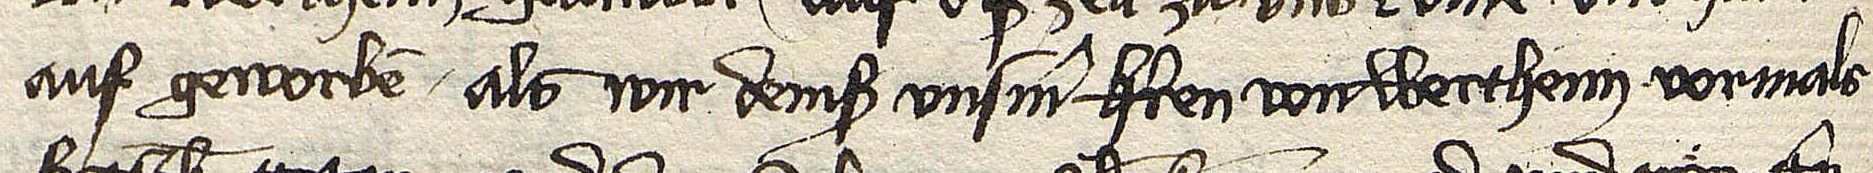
auf geworbe* / als wir demſ* vnſm* h*ren von Wertheim vormals
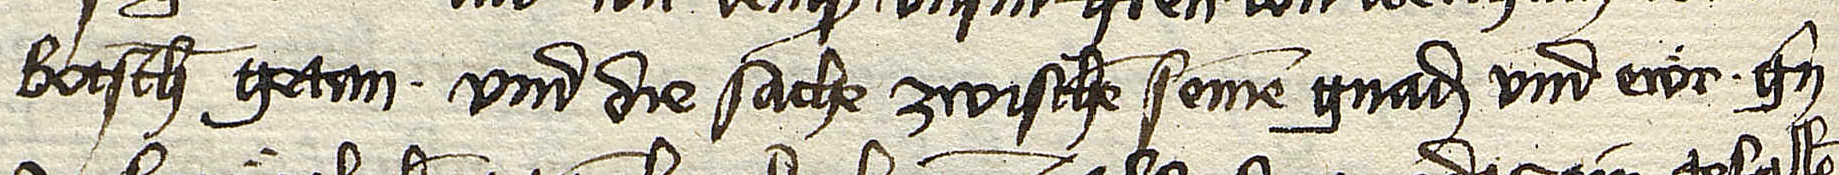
botſch* getan . vnd die ſache ʒwiſche* ſeine* gnad* vnd eẅr . g*n
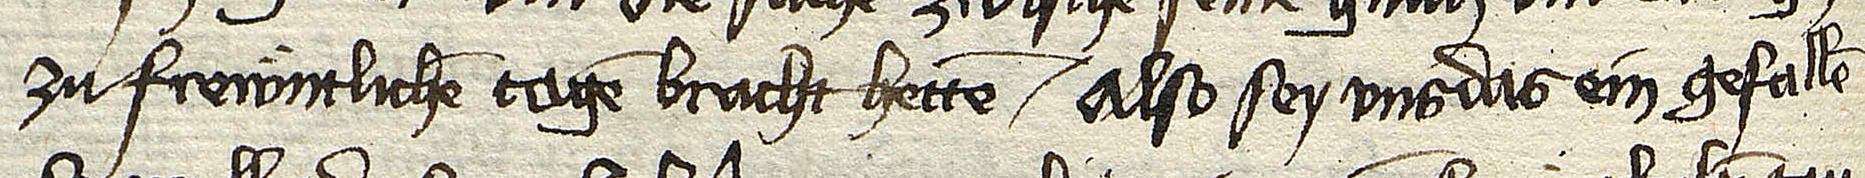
ʒu freẅntliche* tage* bracht hette* / alſo ſey vns das ein gefalle*
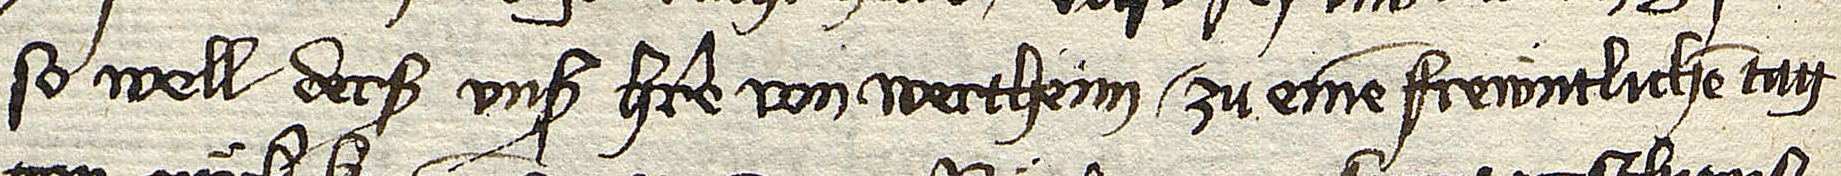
ſo well derſ* vnſ* h*re von wertheim / ʒu eine* freẅntliche* tag
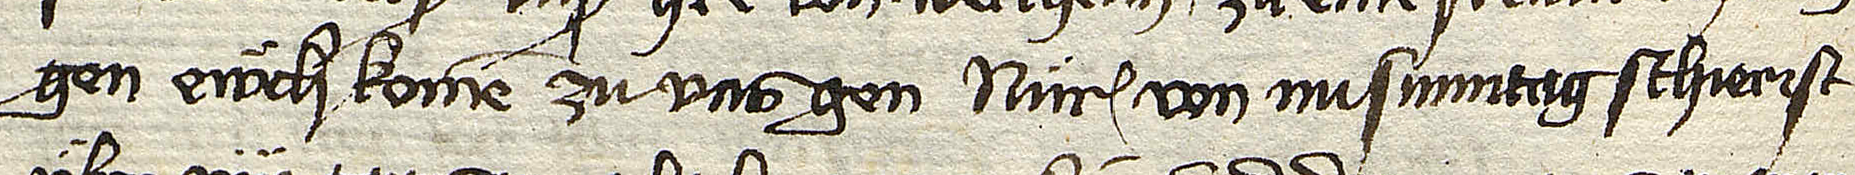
gen eẅch kome* ʒu vns gen Nür* von nu ſunntag ſchieriſt
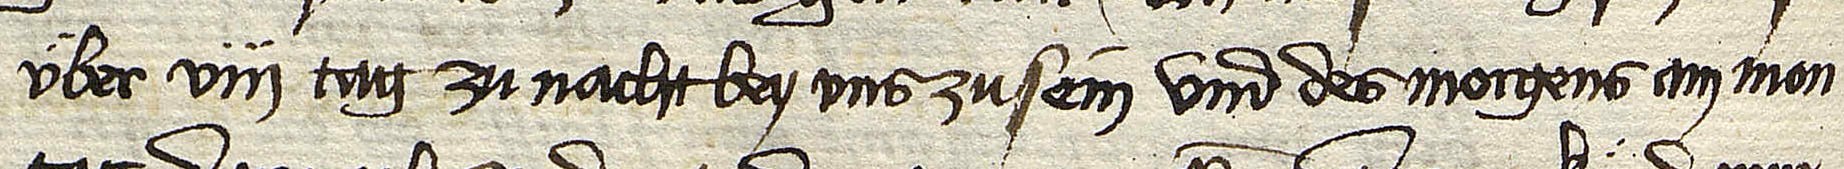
v̈ber viii tag ʒu nacht bey vns ʒu ſein Vnd des morgens am mon
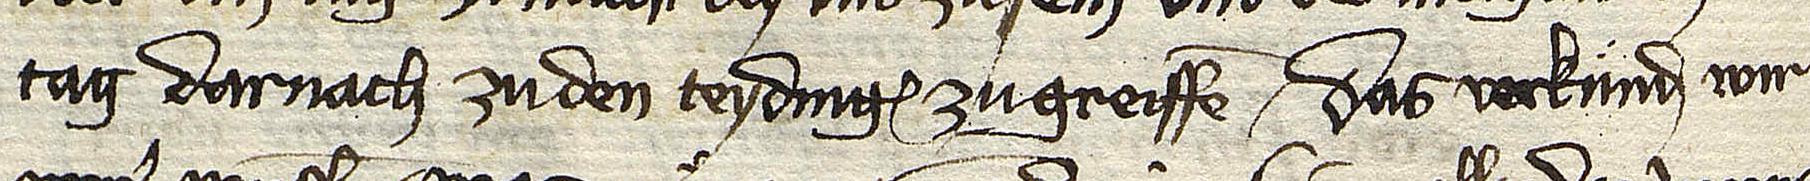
tag Darnach ʒu den teyding* ʒu greiffe* / Das verkünd* wir
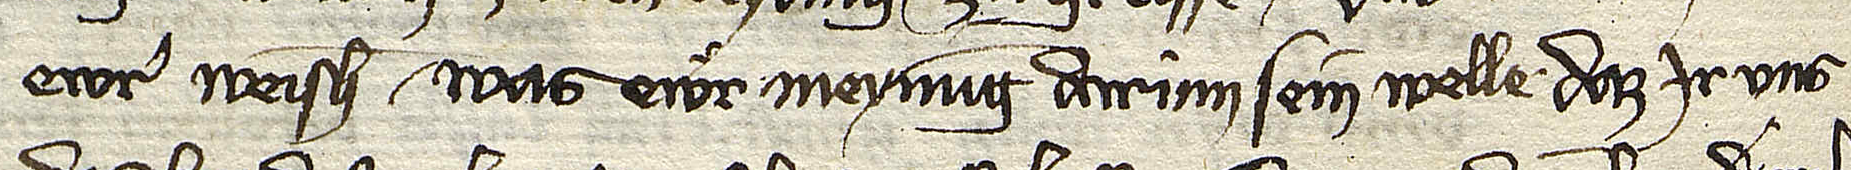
ewr* weiſh* / was eẅr meynu*g darinn ſein welle . daʒ Ir vns
